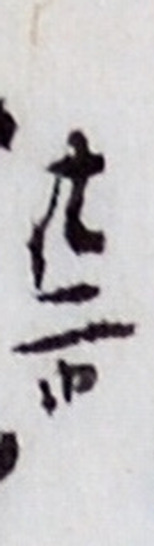廿二日
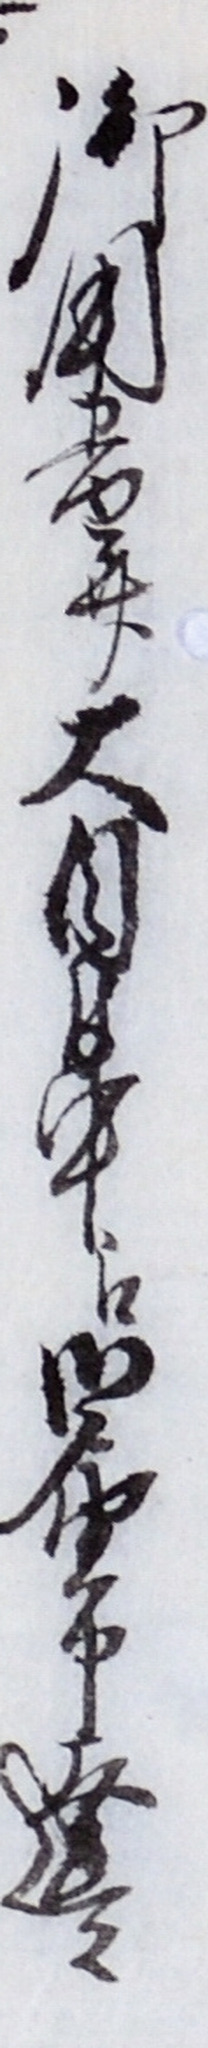御用番并大目付中江御届申達ス
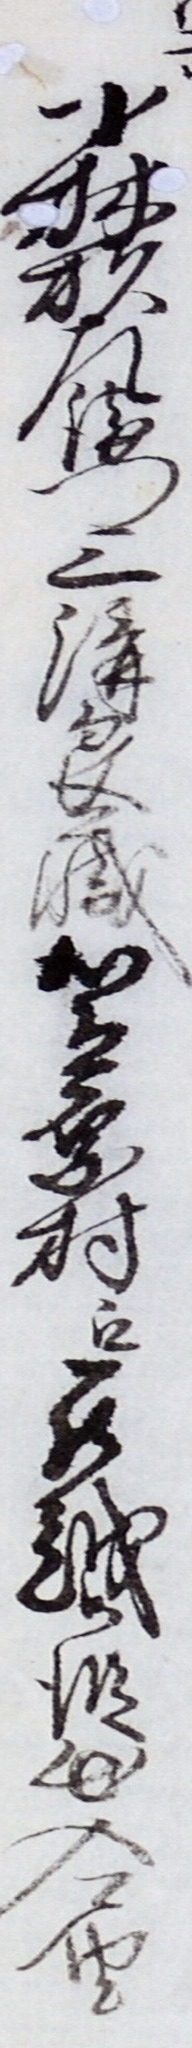一小林杉左衛門三溝良蔵笠原村江罷越候段出入届
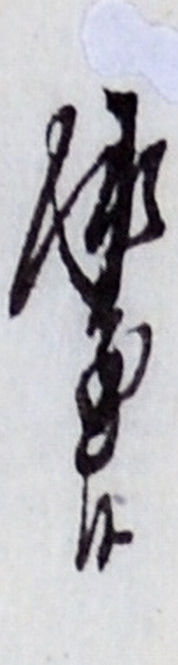承置候
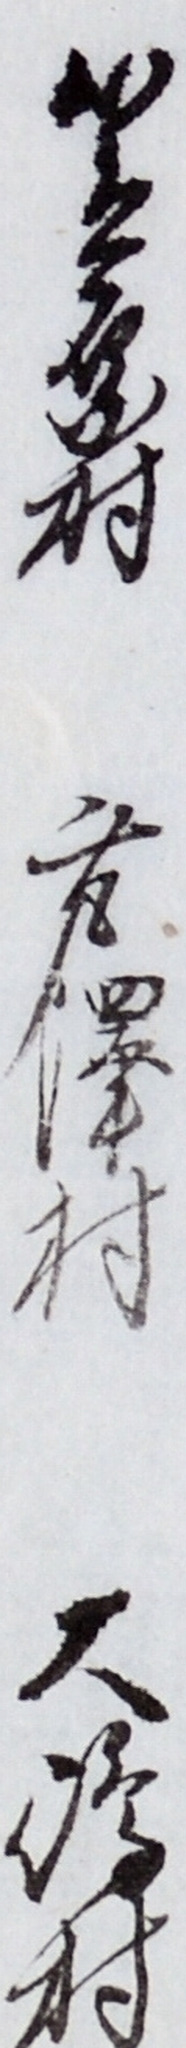笠原村芦沢村大嶋村
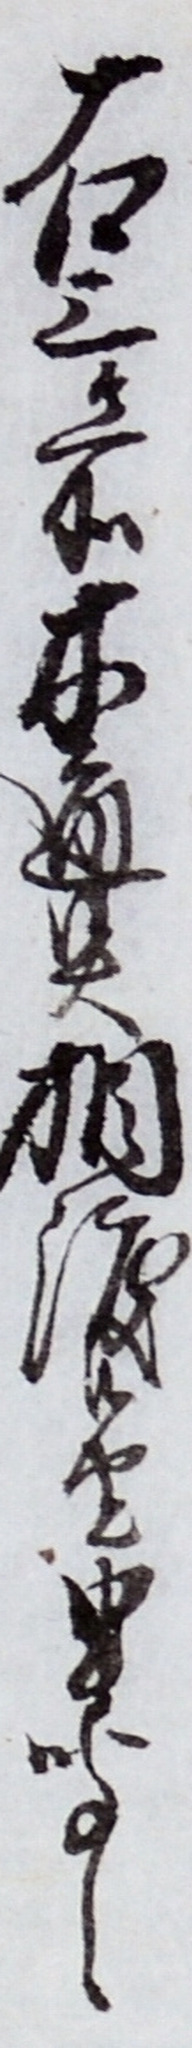右三ヶ所木道具相渡候由申聞候
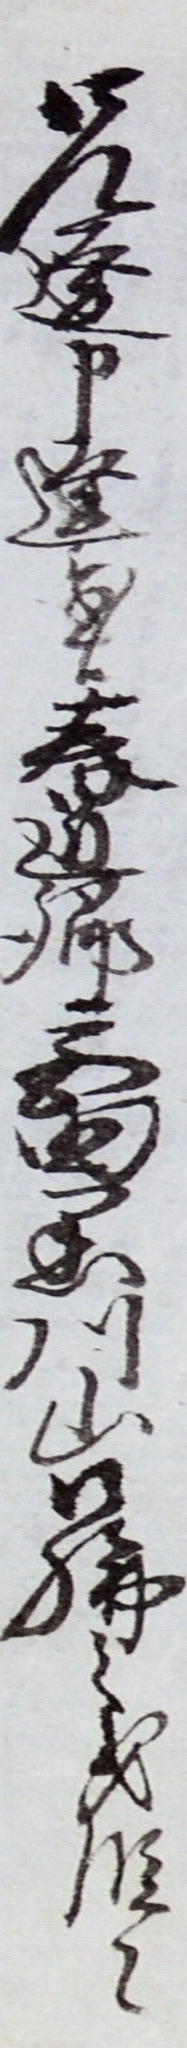一先達申達置候春近郷宮田黒川山口払之義段々
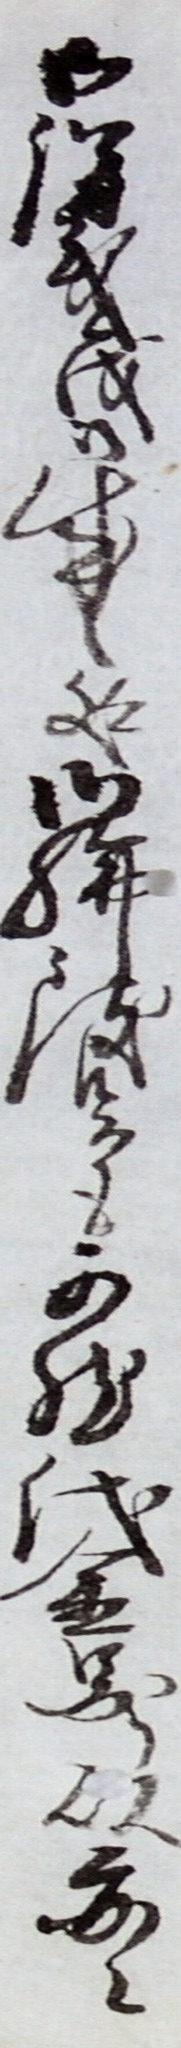御評義も被成候処御払致候而も可然代金図り以亦々
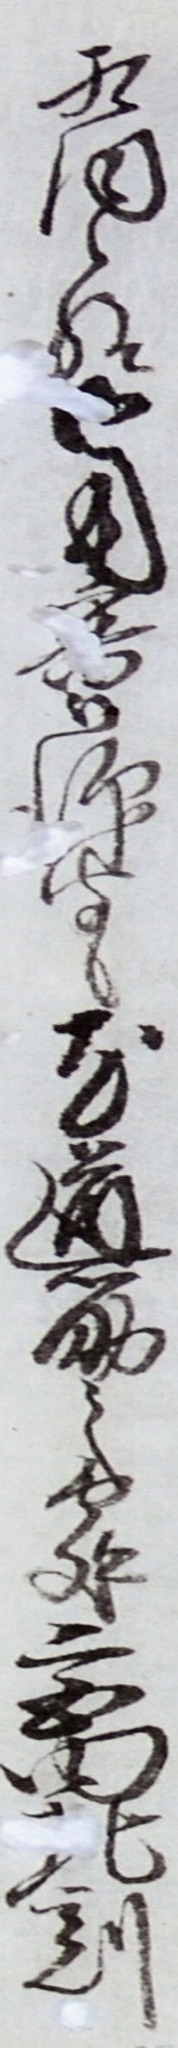相伺候様御用番被仰聞候尤道筋之処宮田北割
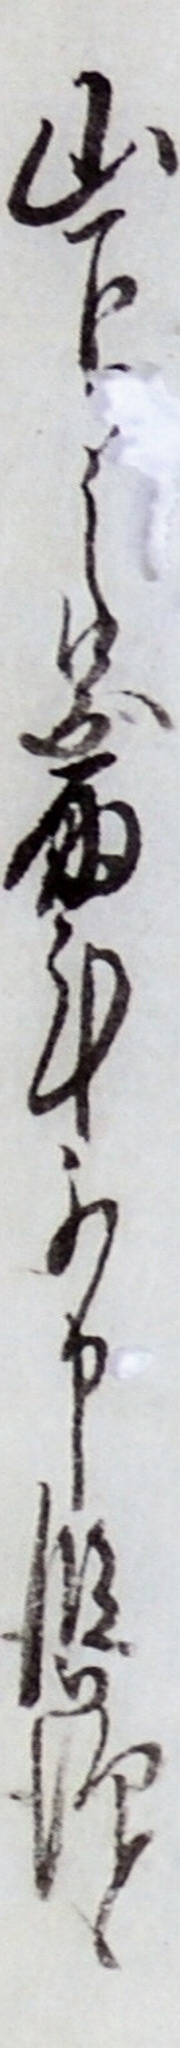山下之図取斗可申段被仰候

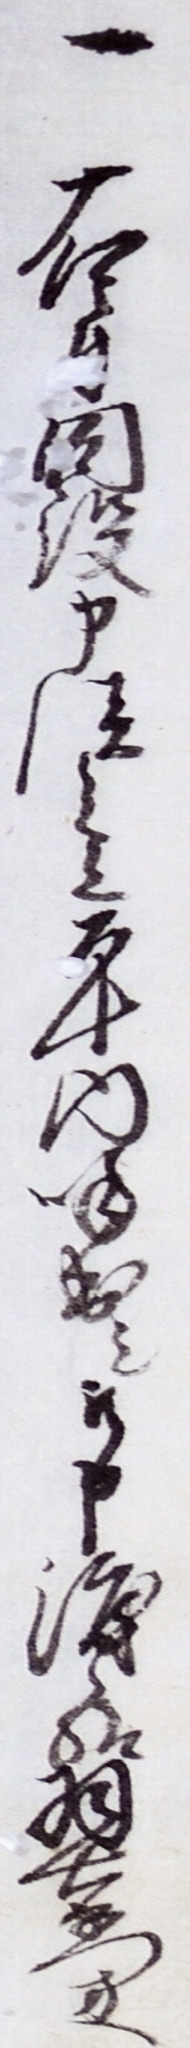一右ニ付目同役申談上平内呼出シ被申渡候様羽右衛門方へ
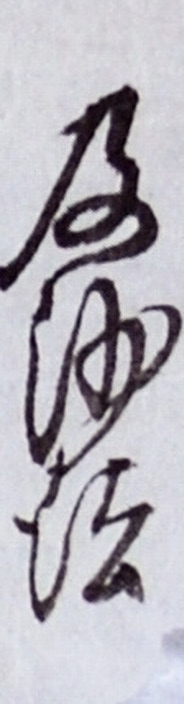及沙汰
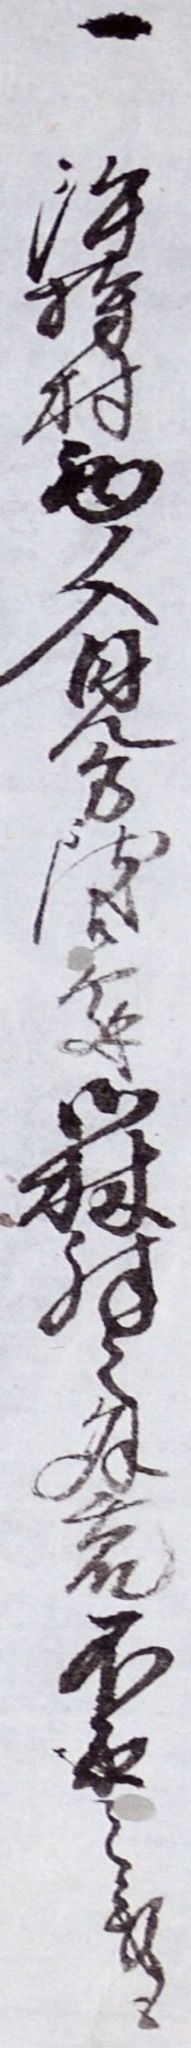一鉾持村西ノ入見分致候処御林殊之外荒不束之義も
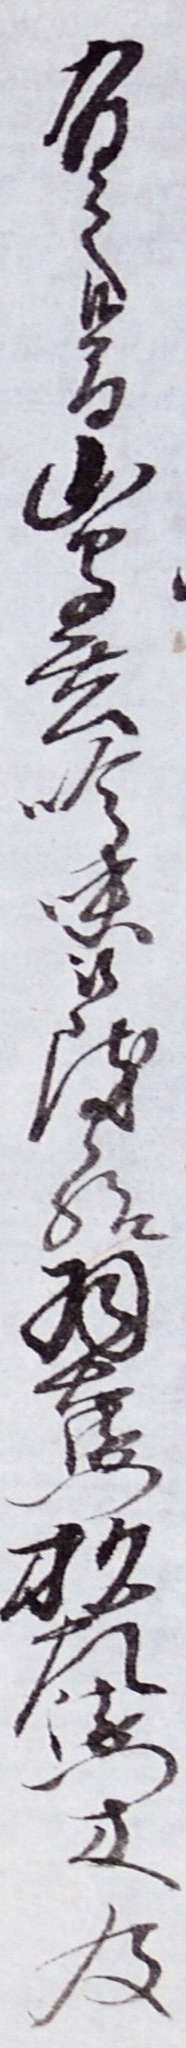有之候間山守共吟味被致候様羽右衛門杉左衛門方へ及
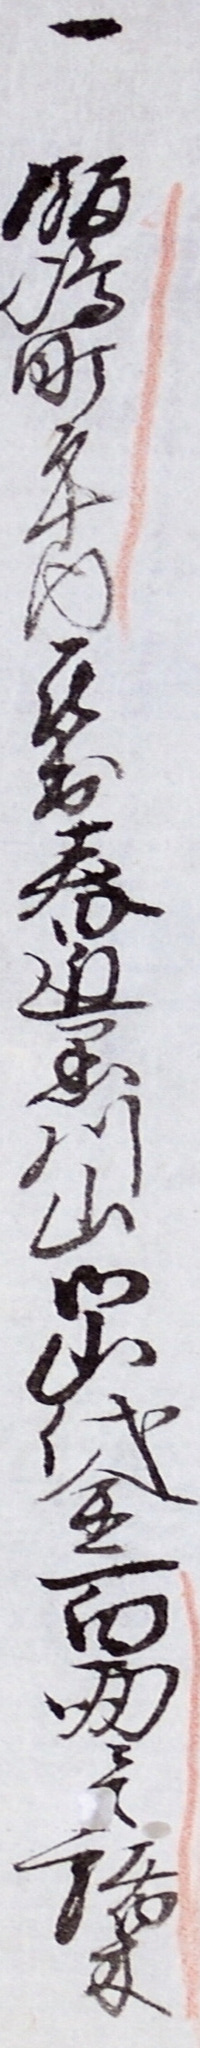一飯嶋町平内罷出春近黒川山御山代金百両ニて諸木
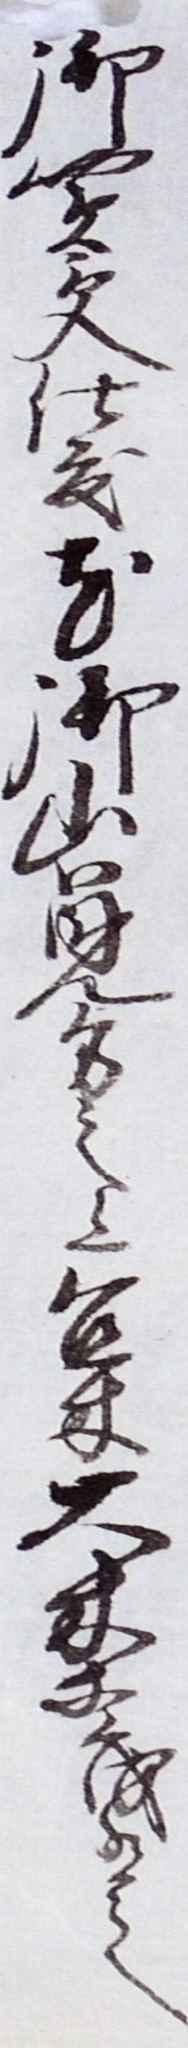御買受仕度尤御山御見分之上宜木大木等も有之
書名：御山奉行御用控
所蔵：伊那市立高遠町図書館・合同会社AMANE
